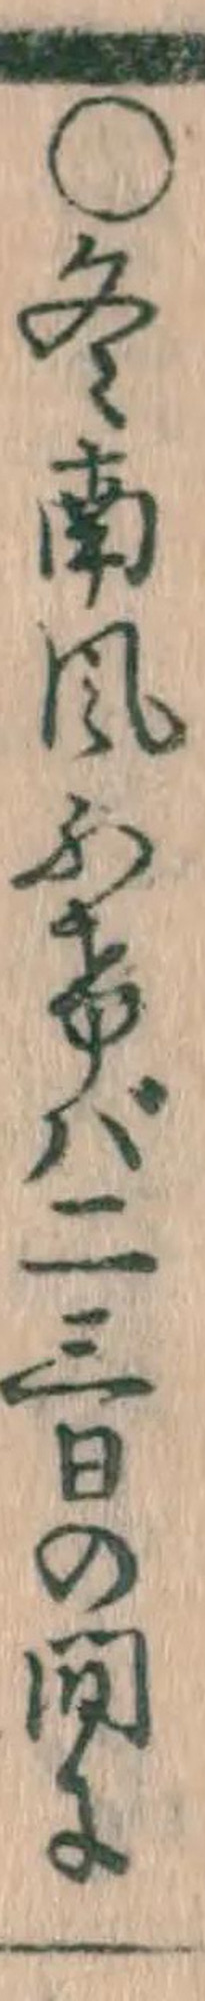○冬南風ふけば二三日の間に
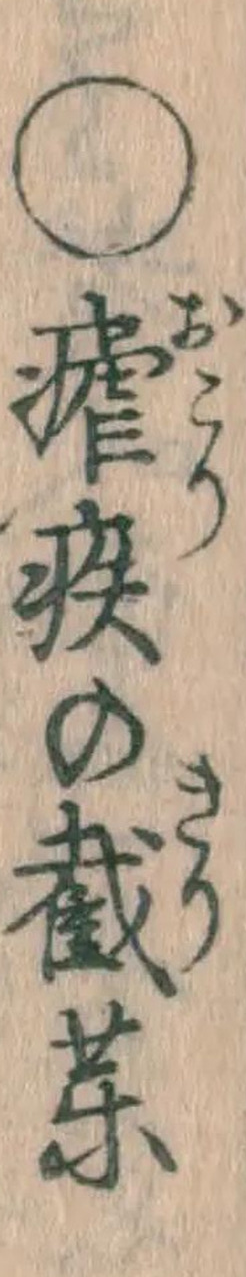○瘧疾の截薬
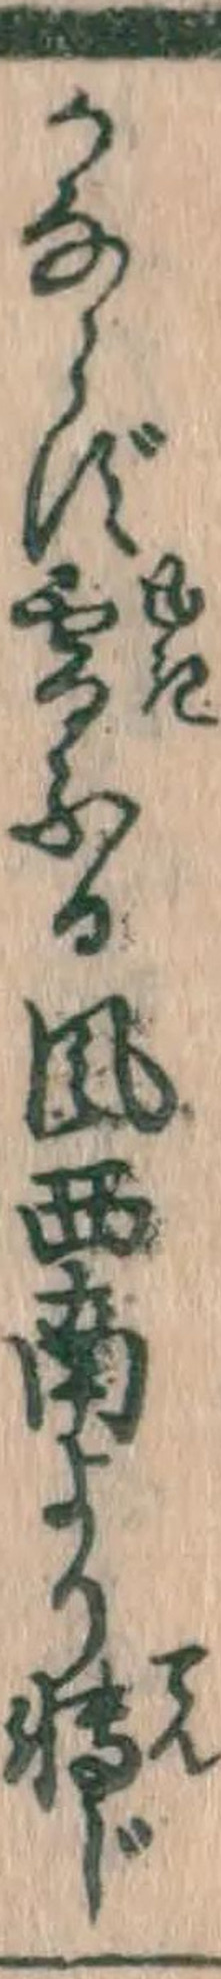かならず雪ふる風西南より転じ
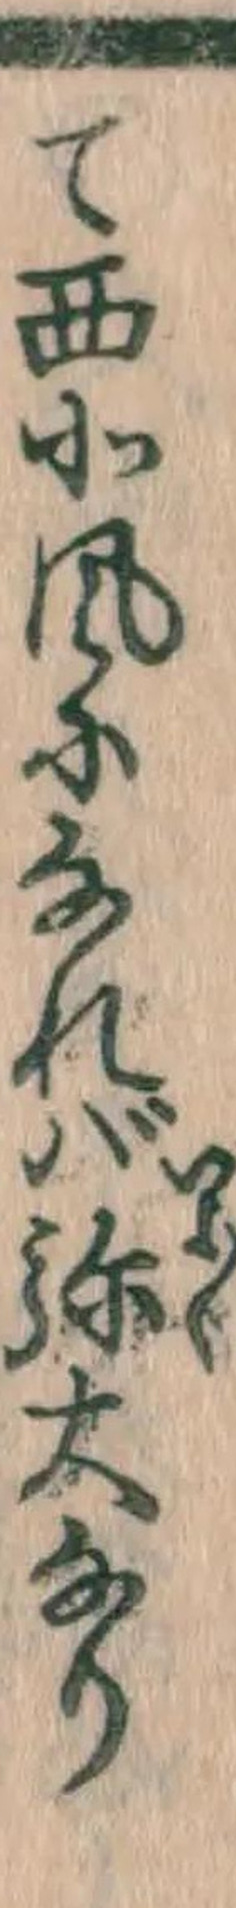て西北風になれば弥大なり
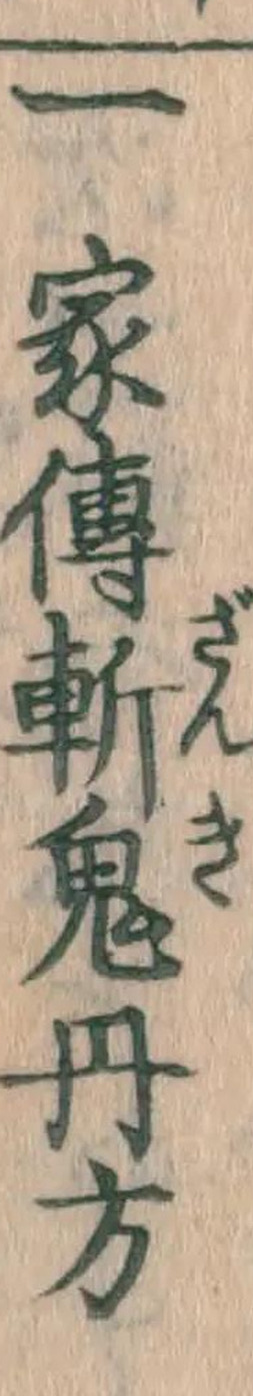一家伝斬鬼丹方
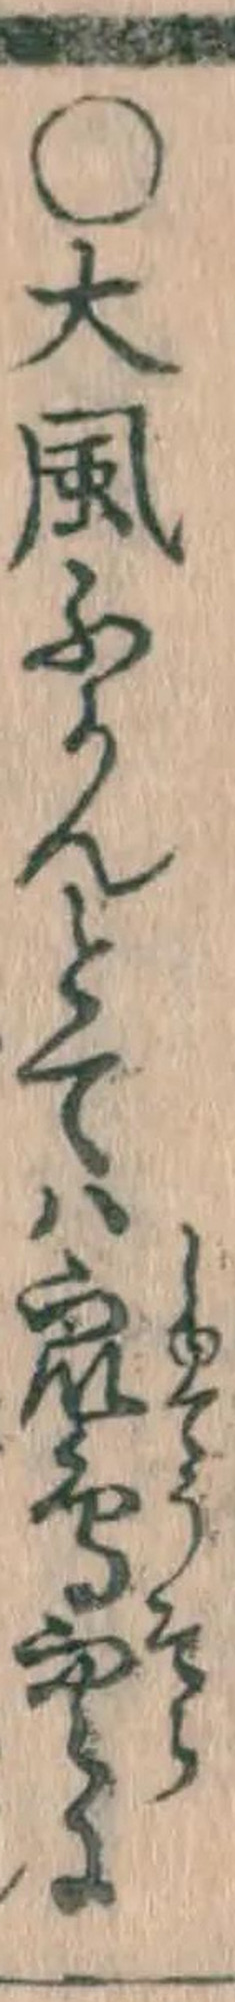○大風ふかんとては衆鳥空に
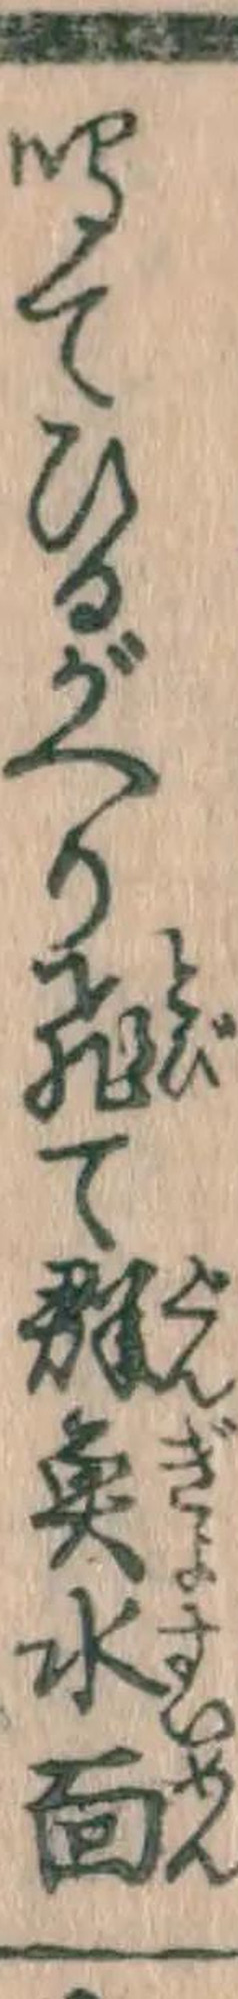鳴てひるがへり飛て群魚水面
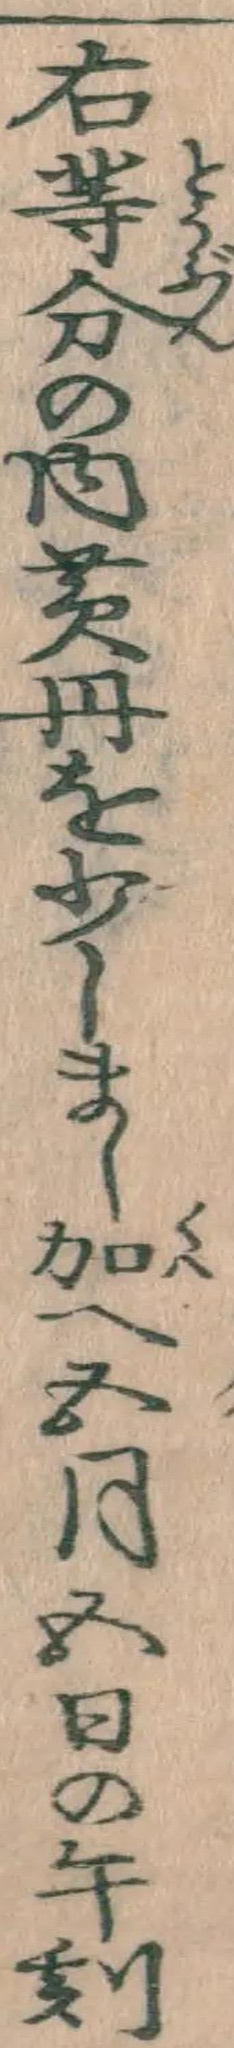右等分の内黄丹を少しまし加へ五月五日の午刻
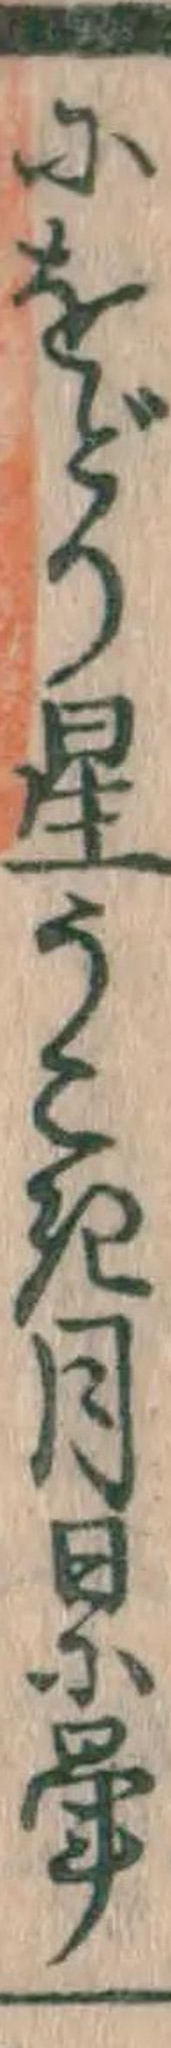にをどり星うこき月日に暈
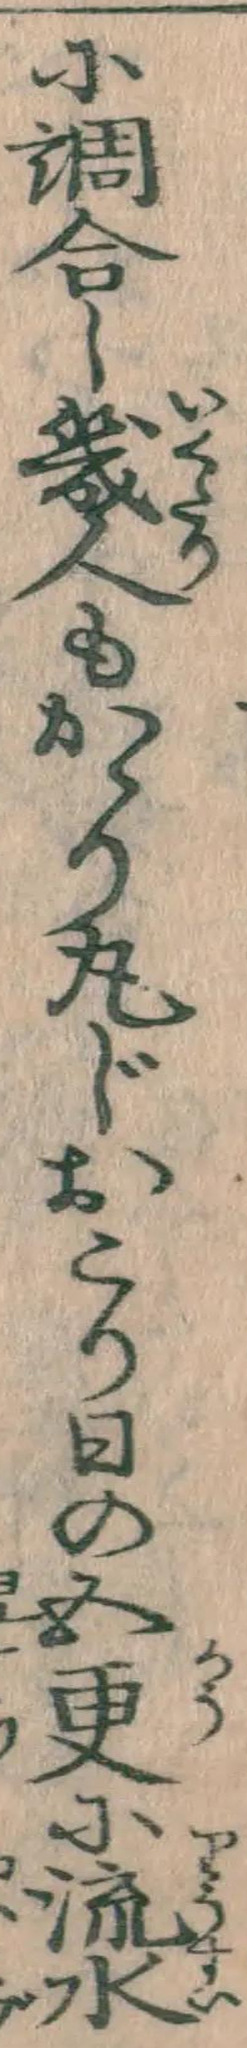に調合し幾人もかゝり丸じおこり日の五更に流水
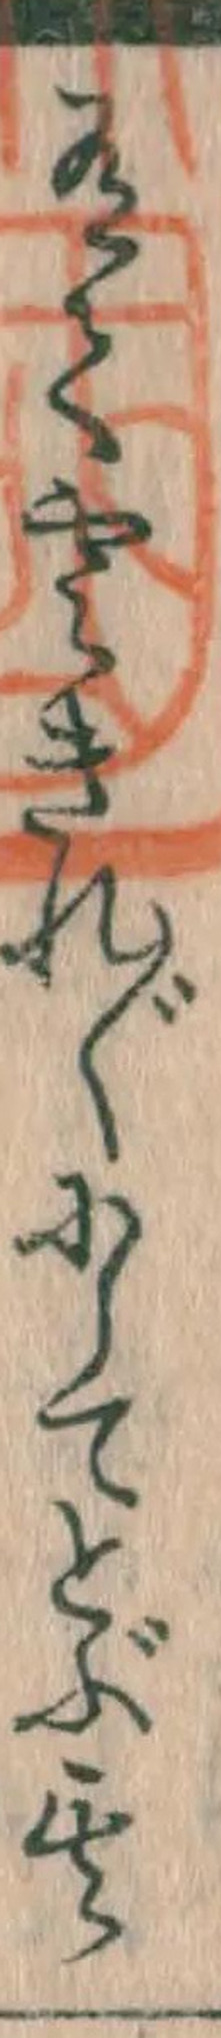有て雲きれ〴〵にしてとぶ其
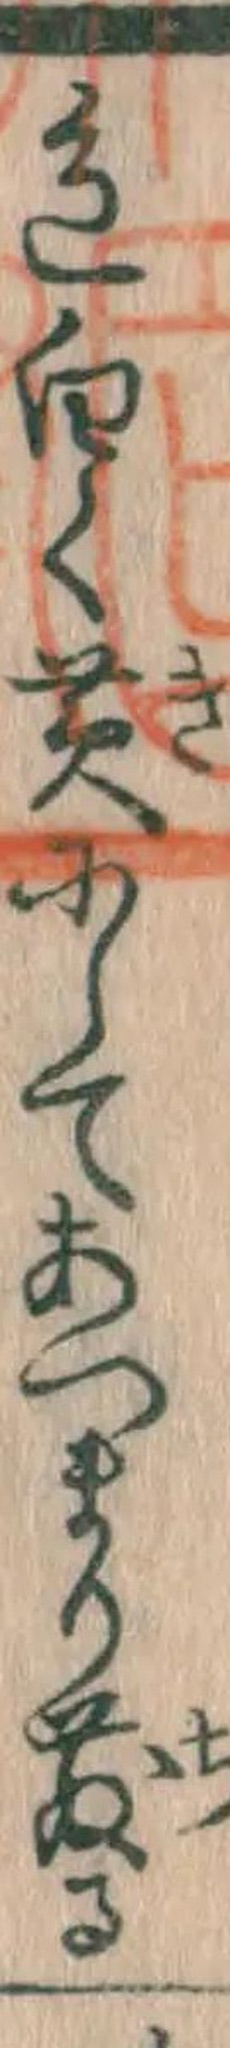色白く黄にしてあつまり散る
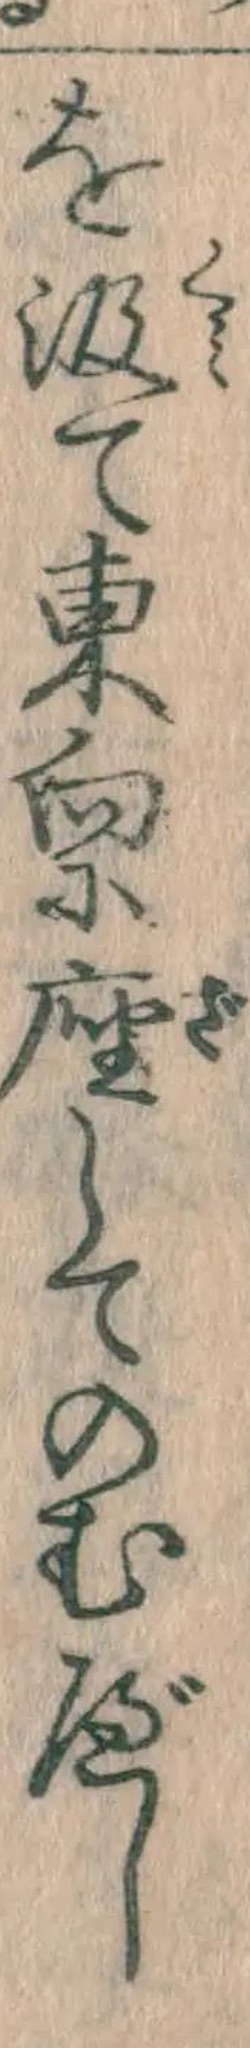を汲て東向に座してのむべし
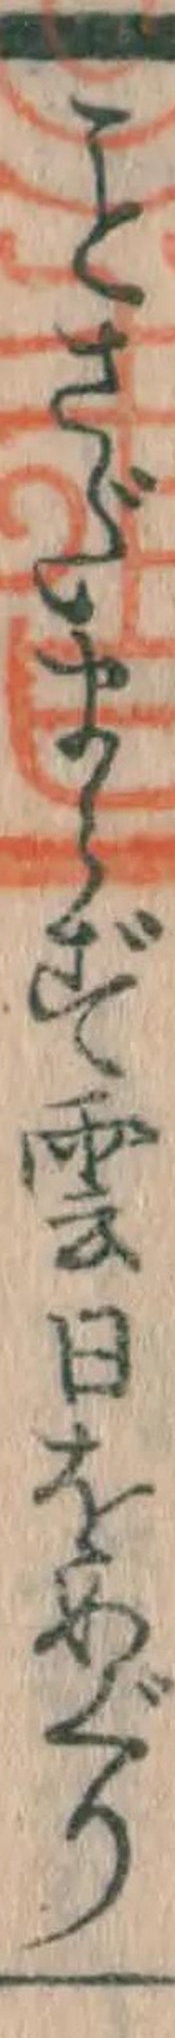ことさだまらず雲日をめぐり
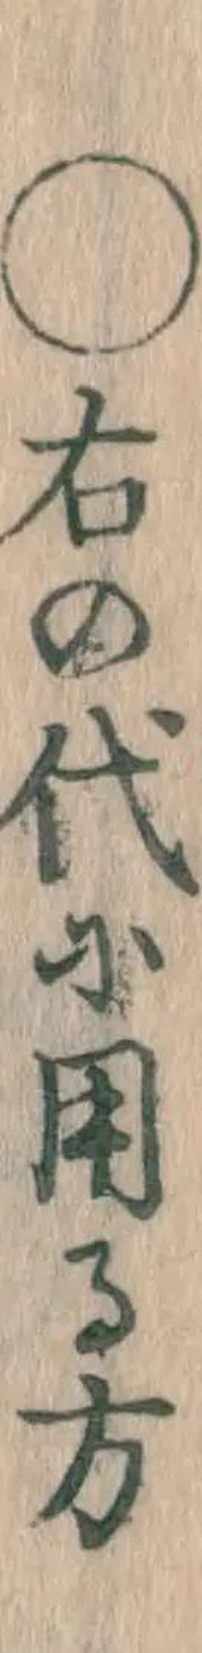○右の代に用る方
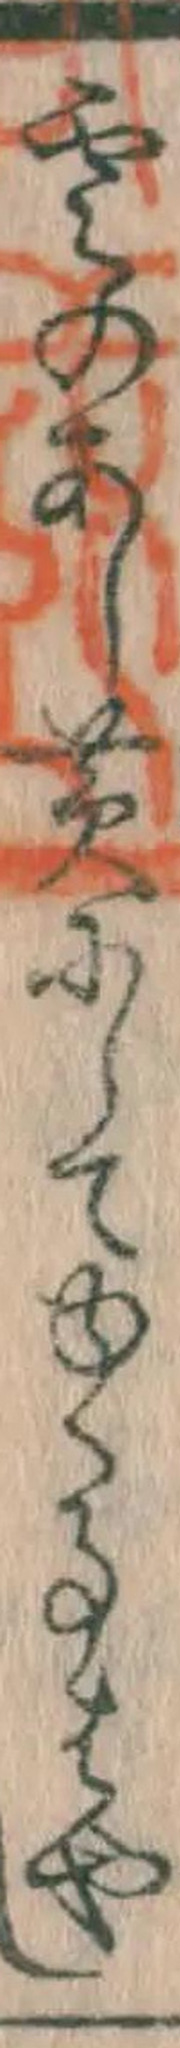雲のあし黄にしてゆく事はやし
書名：広益秘事大全 3巻. [4]
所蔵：国立国会図書館 National Diet Library, JAPAN
